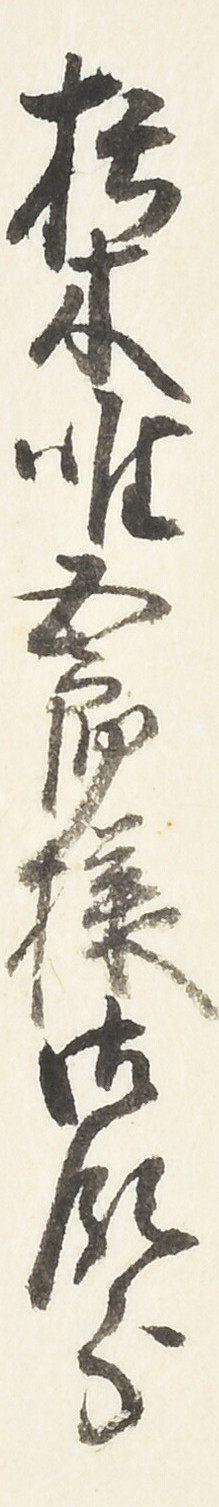朽木唯五郎様御領分
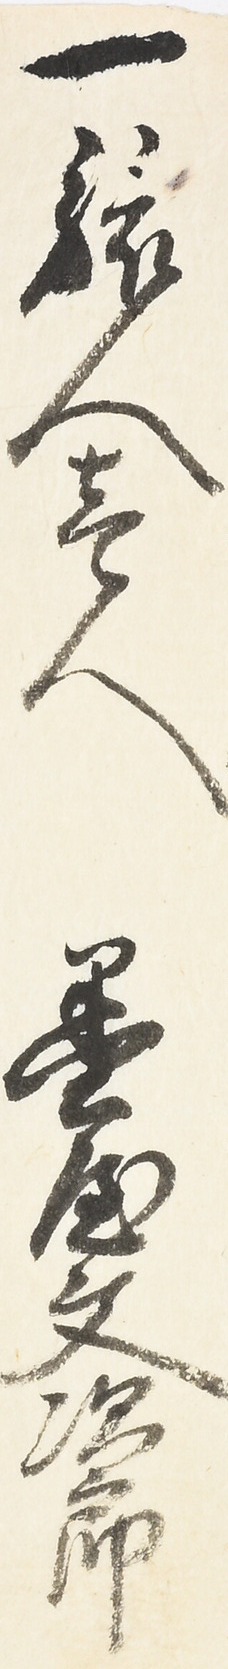一旅人壱人墨屋文次郎
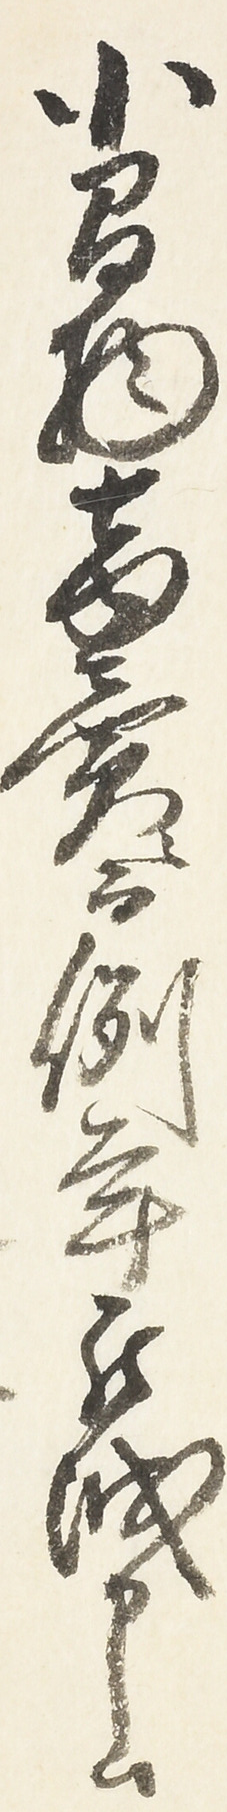小間物商売ニ而例年罷越申候
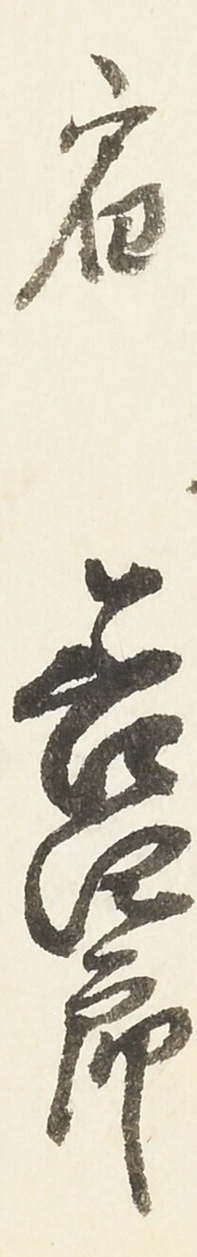宿善四郎
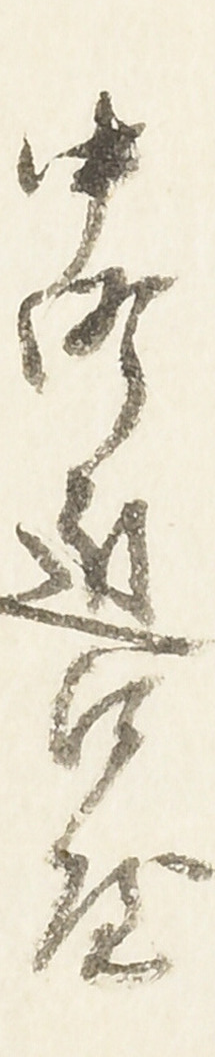中町近江屋
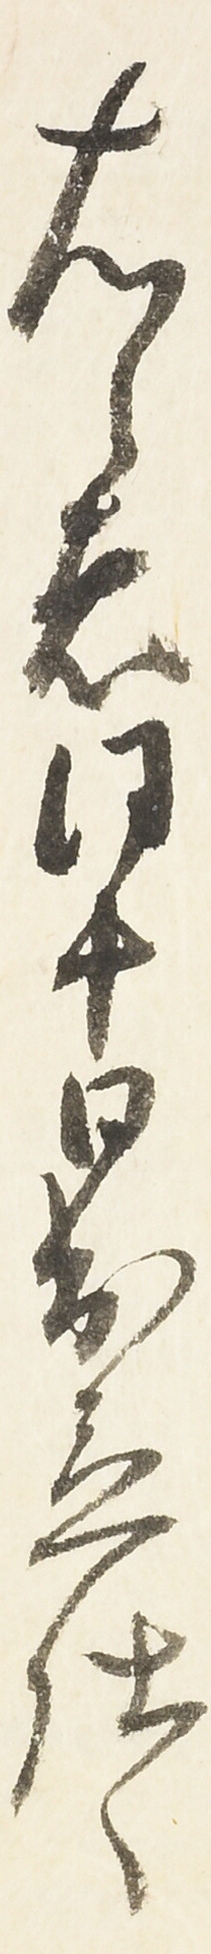右之者同十日出立仕候
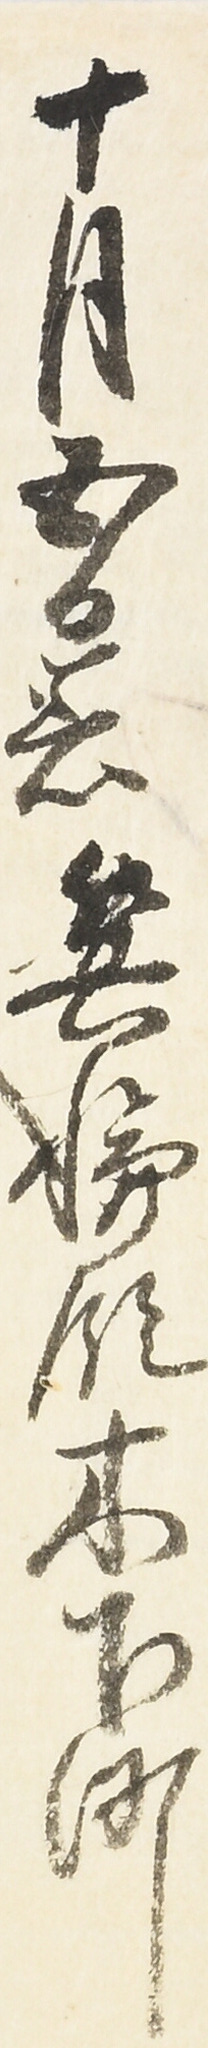十月五日着箕輪領木下町
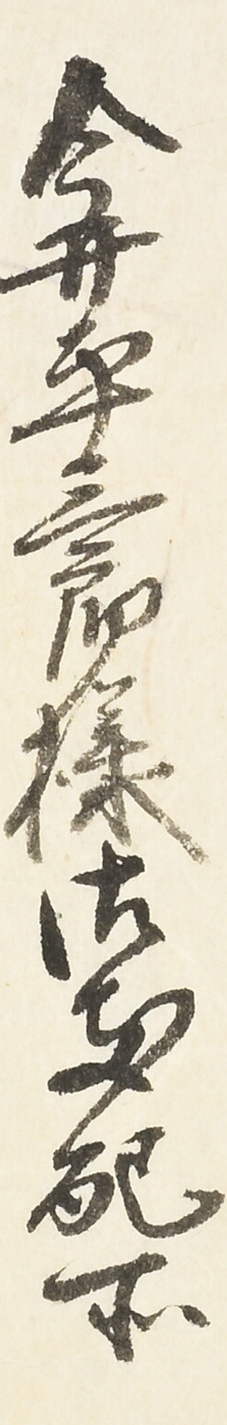今井平三郎様御支配所
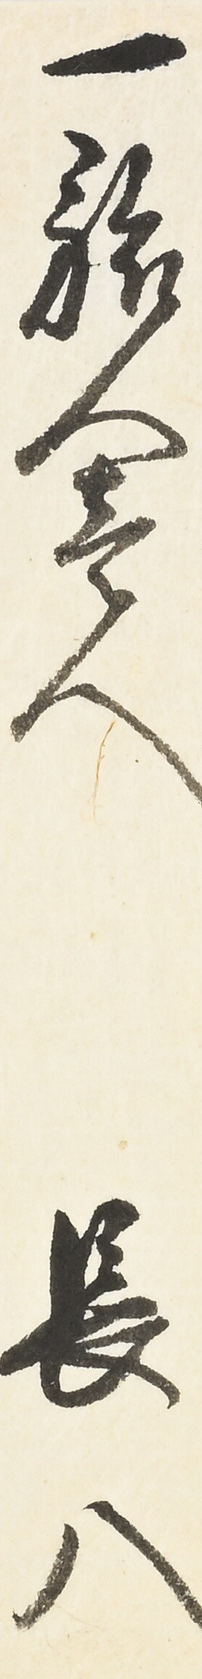一旅人壱人長八
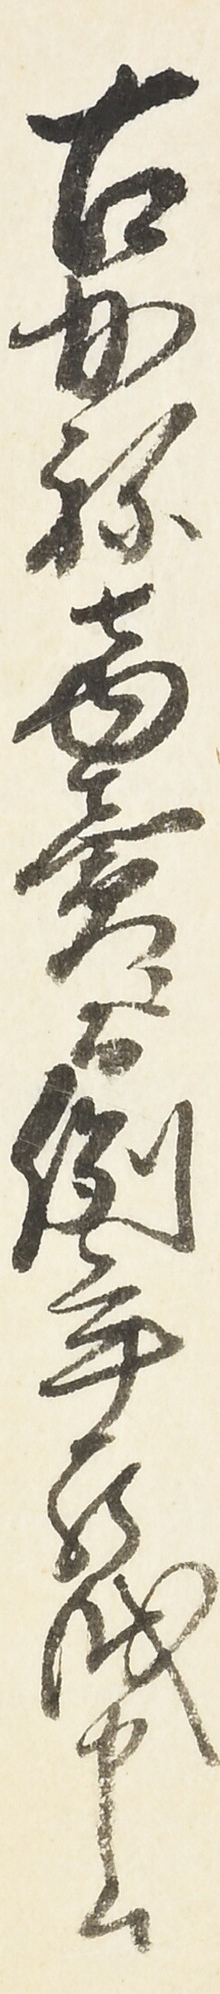こかね商売ニ而例年罷越申候
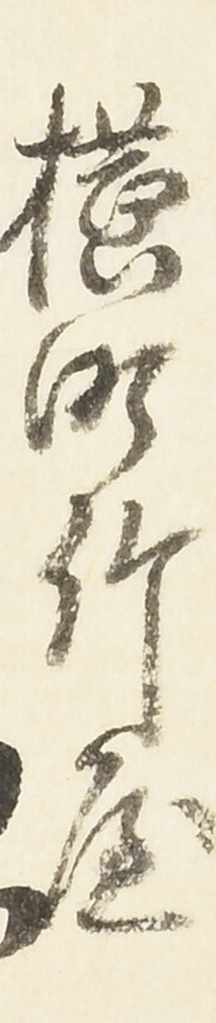横町竹屋
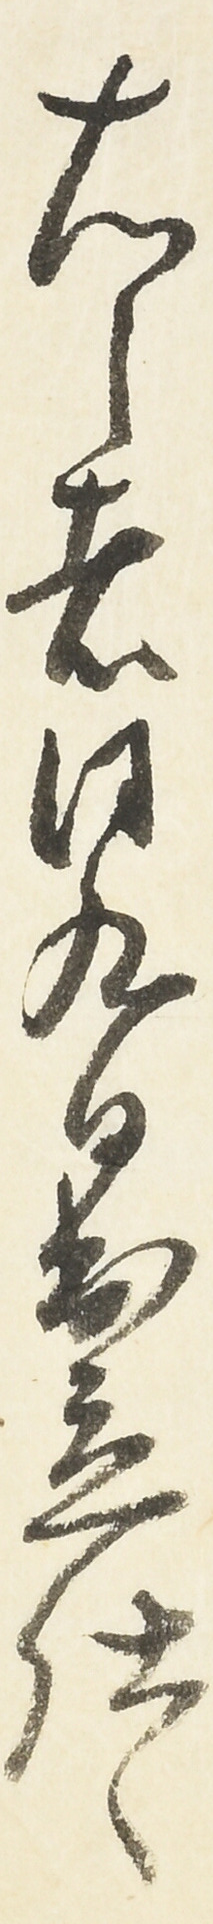右之者同九日出立仕候
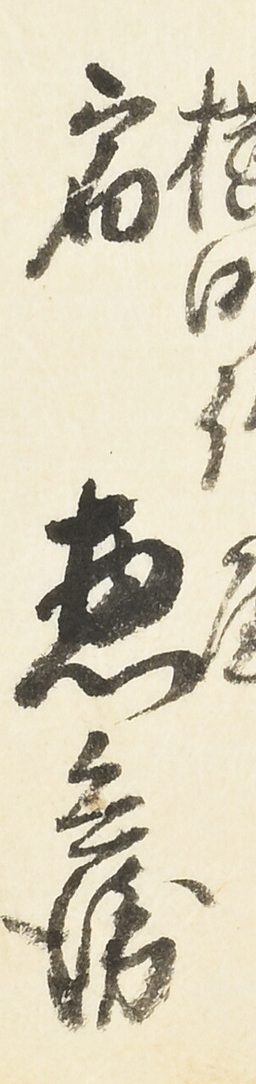宿惣兵衛
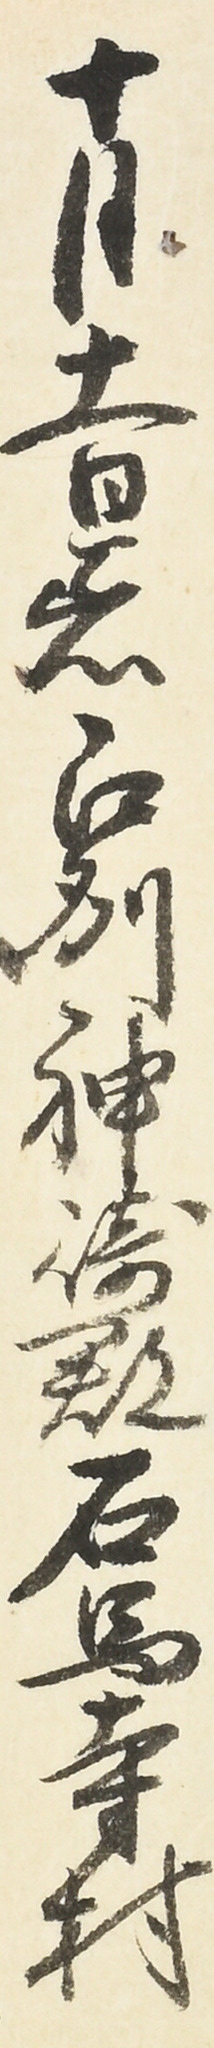十月十一日江州神崎郡石馬寺村
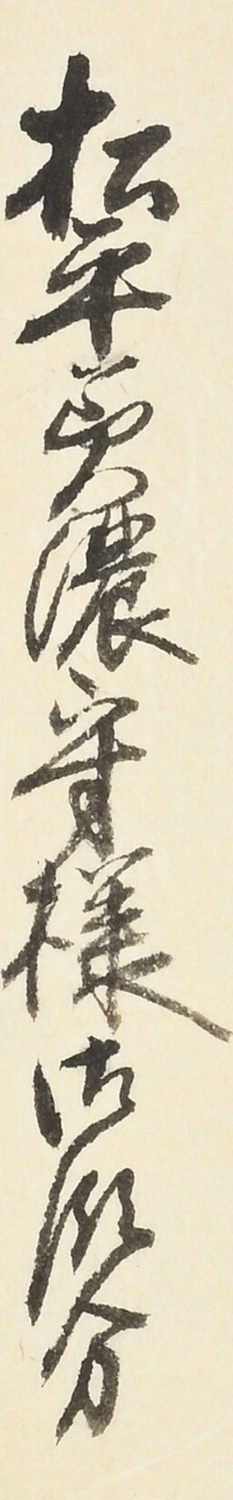松平美濃守様御領分
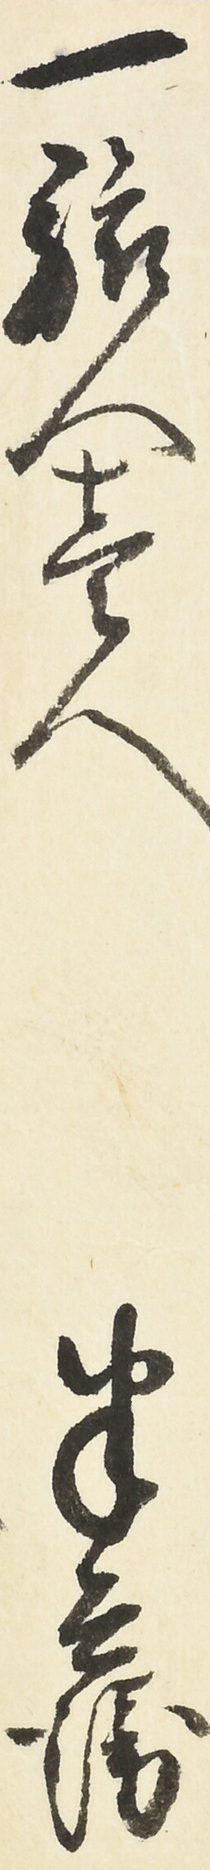一旅人壱人半兵衛
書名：町中旅人泊控帳
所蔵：伊那市立高遠町図書館・合同会社AMANE
